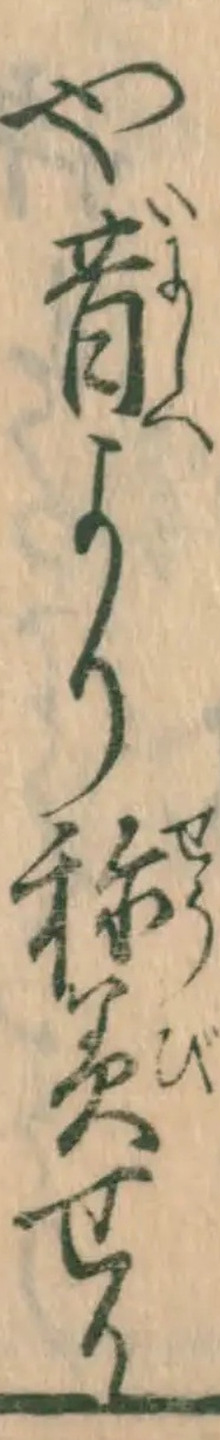や昔より称美せり
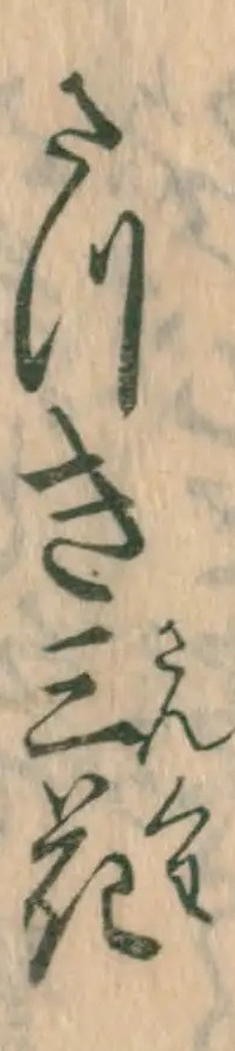さつき三花
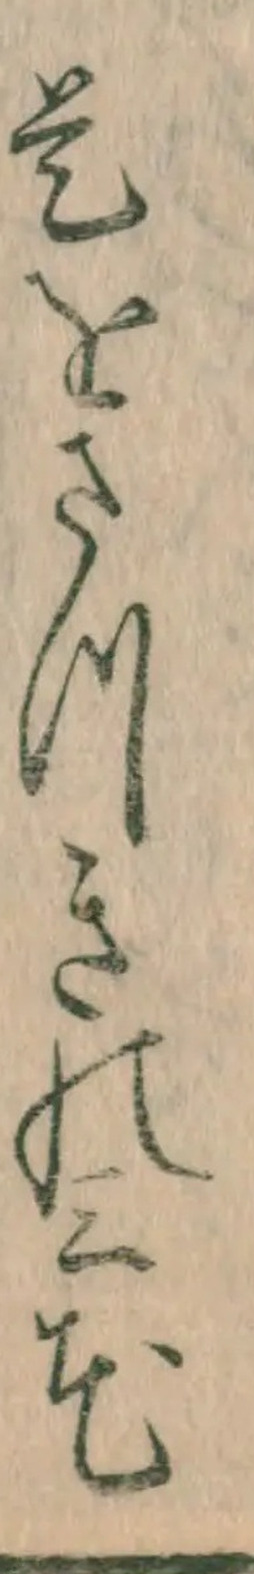是をさつきの三花
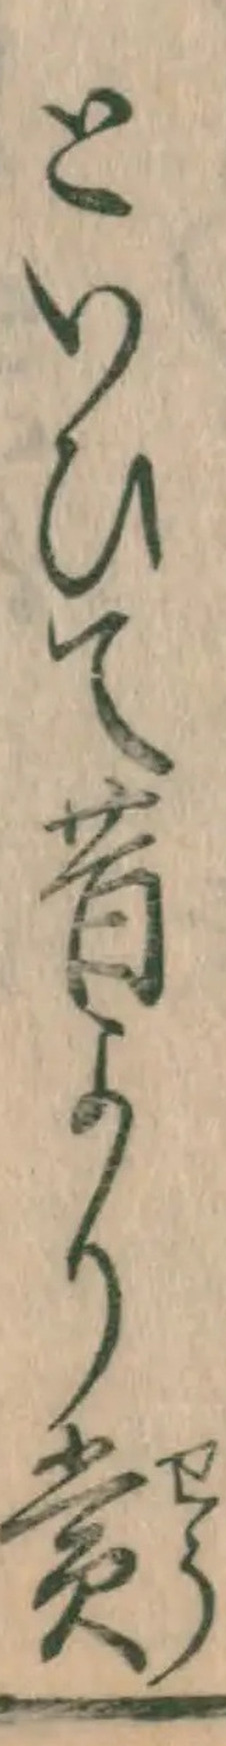といひて昔より賞
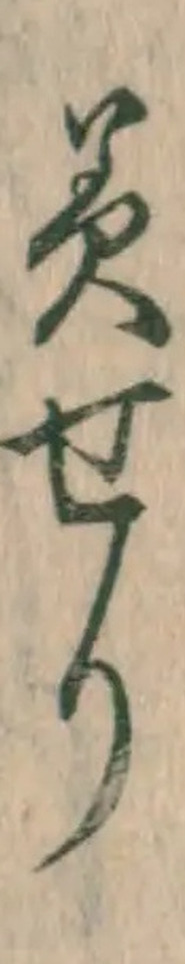美せり
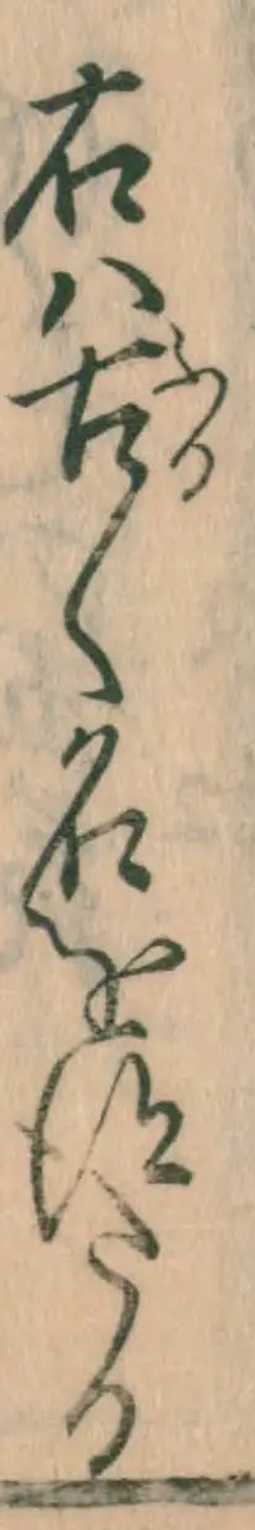右は古く名を得たる
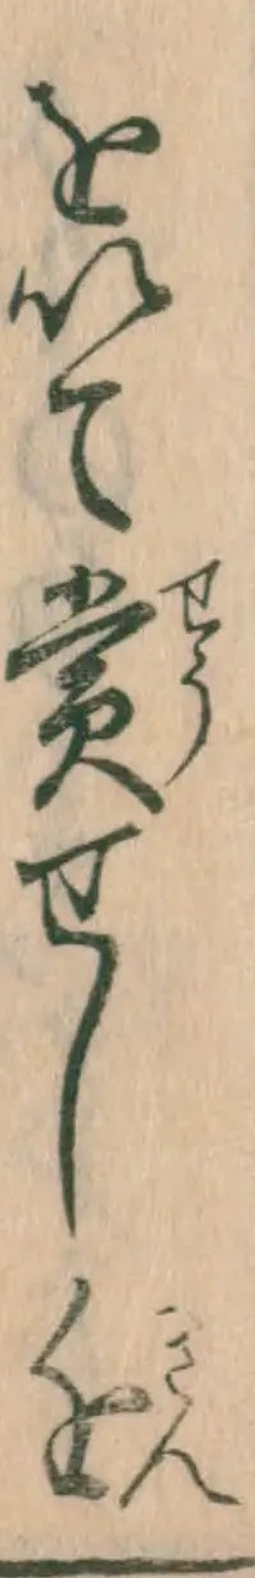を以て賞せし近
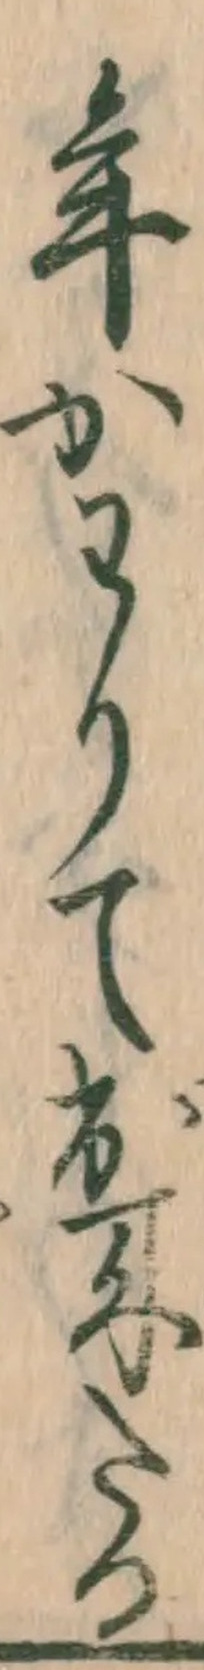年かわりて出来たる
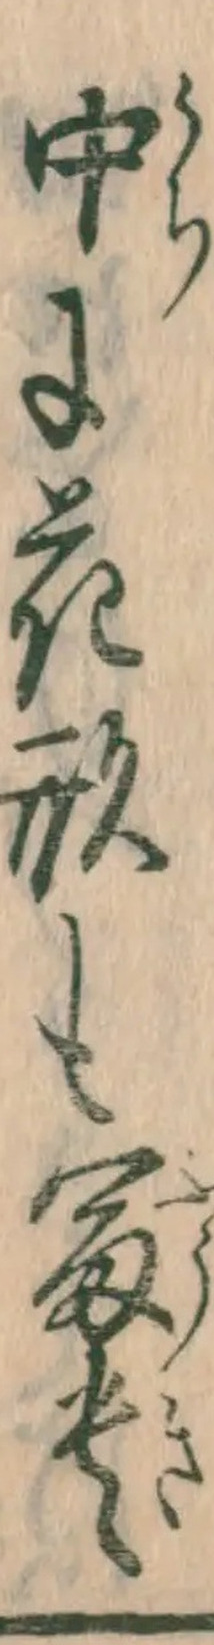中に花形も冨貴
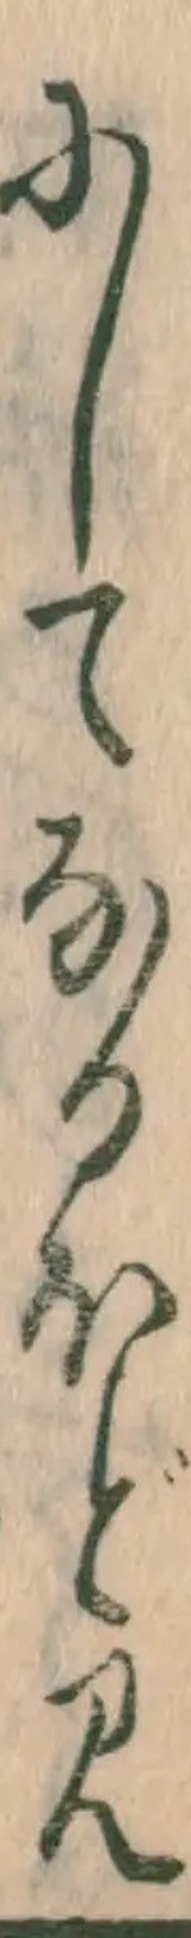にしてなるほど見
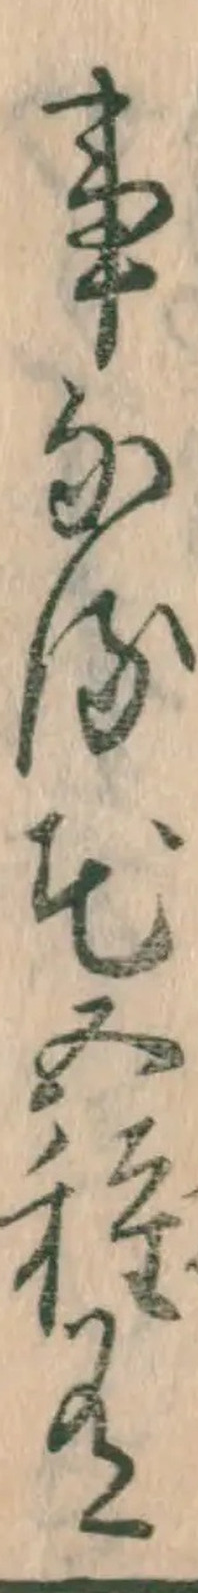事なる花五種有
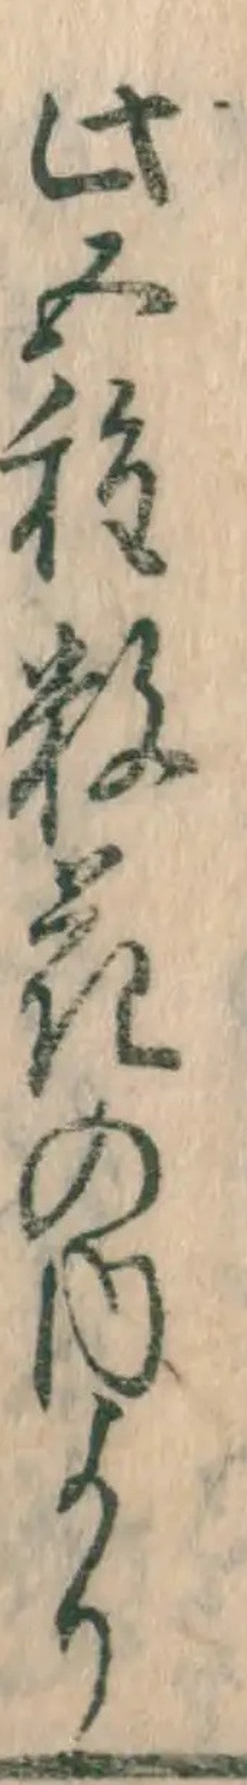此五種数花の内より
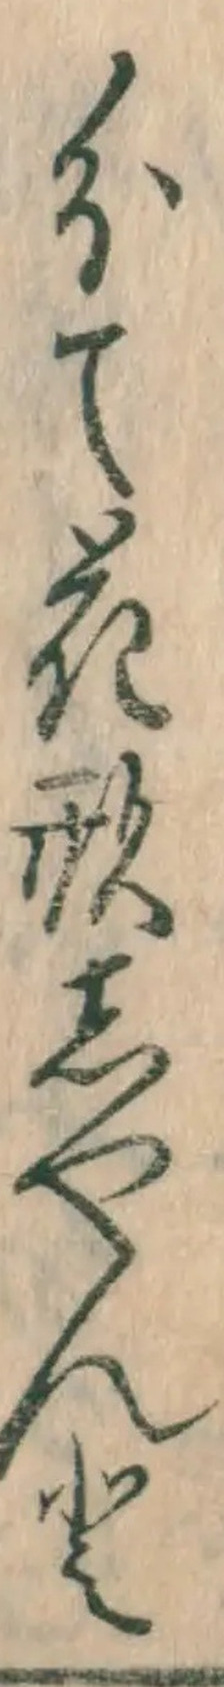分て花形しやんと

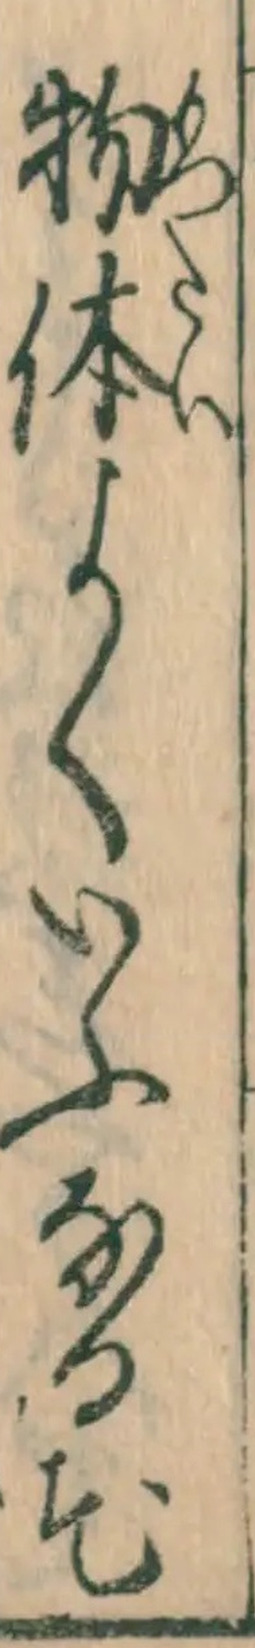物体よくいふなる花
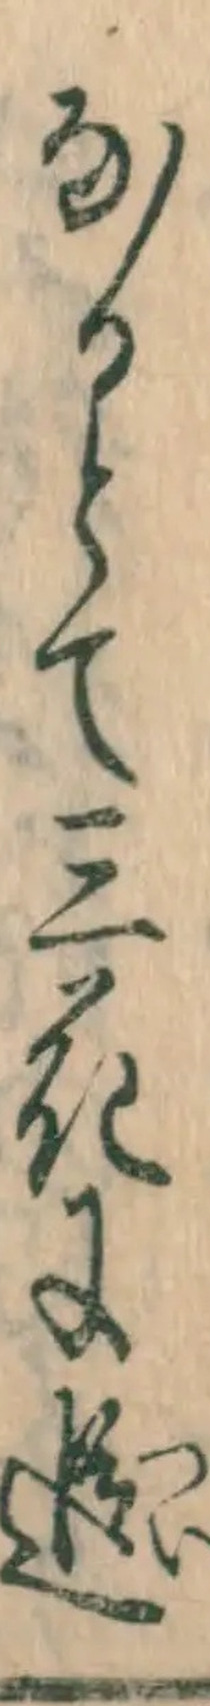なるとて三花に追
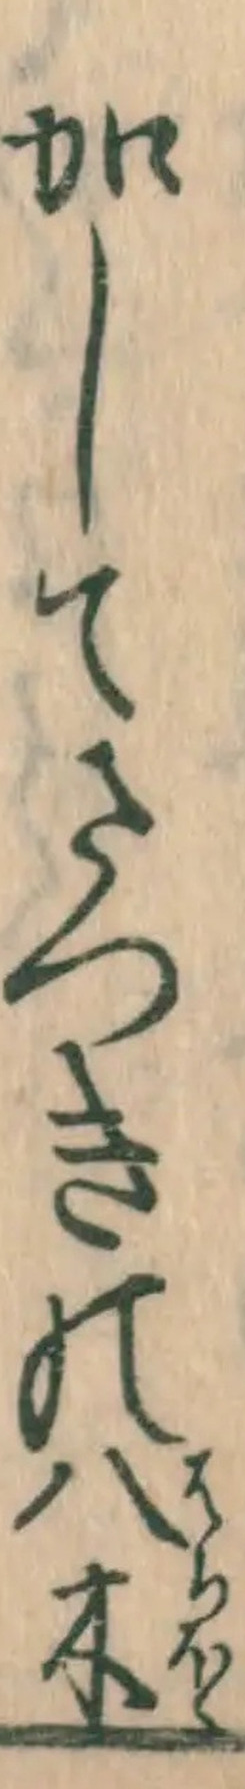加してさつきの八木
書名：錦繍枕 5巻. [5]
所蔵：国立国会図書館 National Diet Library, JAPAN
